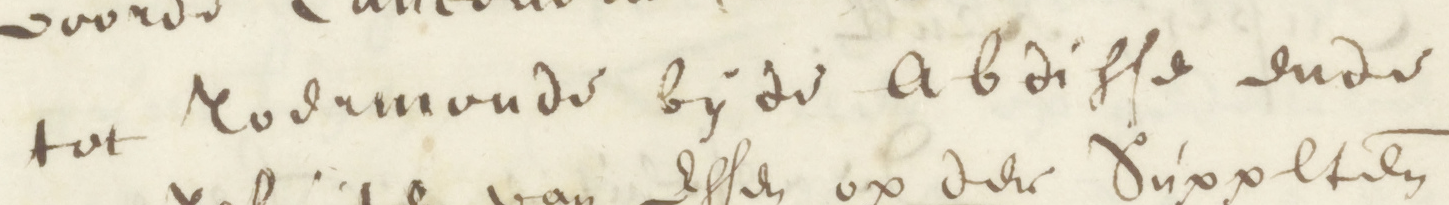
tot roermonde bij de abdisse ende
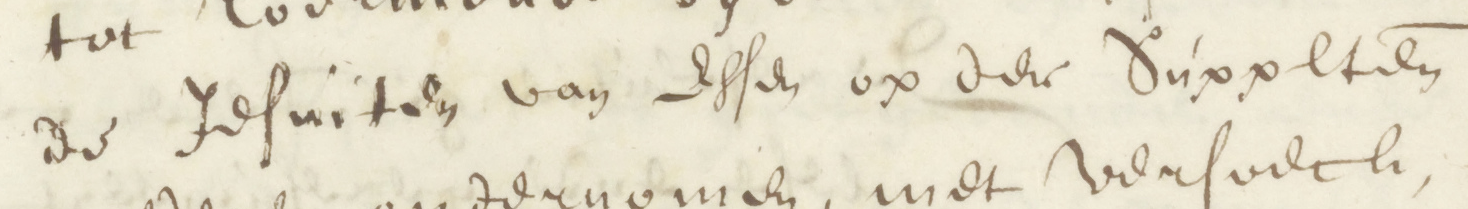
de Jesuiten van Essen op der Supplten
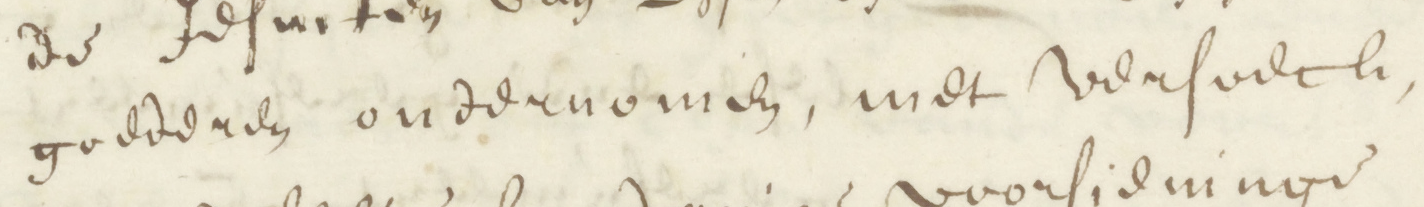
goederen ondernomen, met versoeck
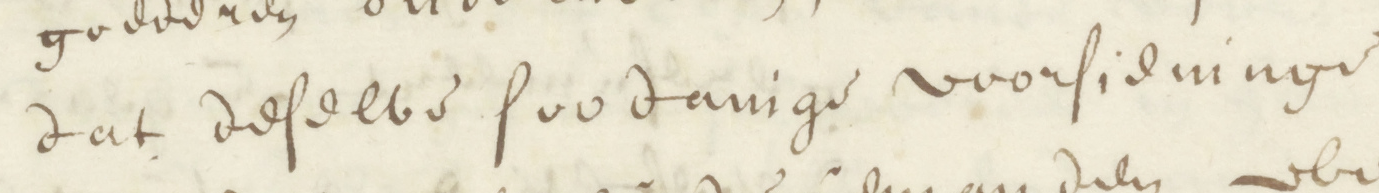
dat deselve soodanige voorsieninge
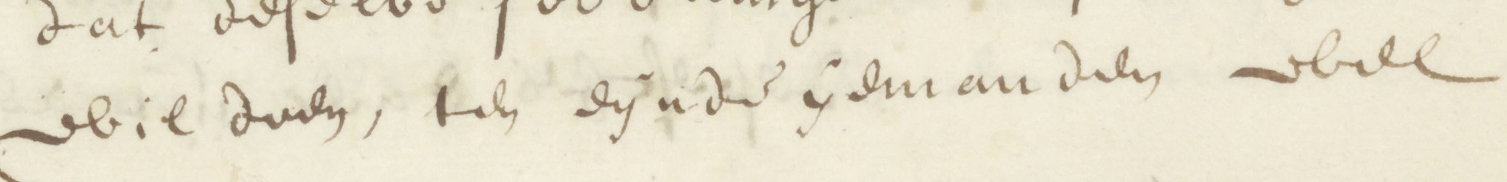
wil doen, ten eijnde ijemanden wel
